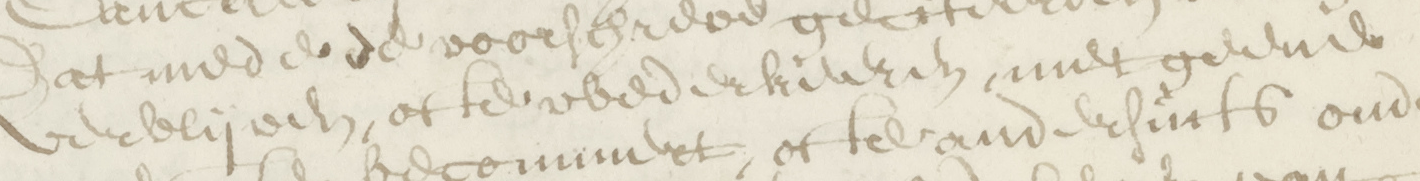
verblijven, ofte wederkeeren met geene
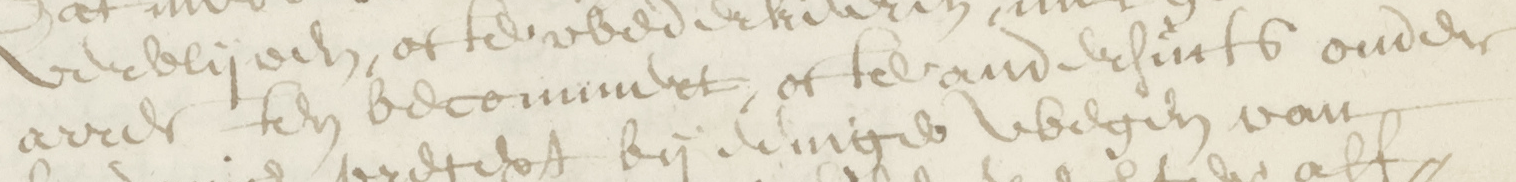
arresten becommert, ofte andersints onder
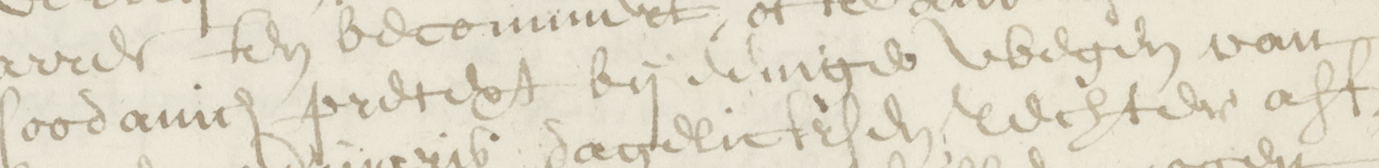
soodanich pretext bij eenige wegen van
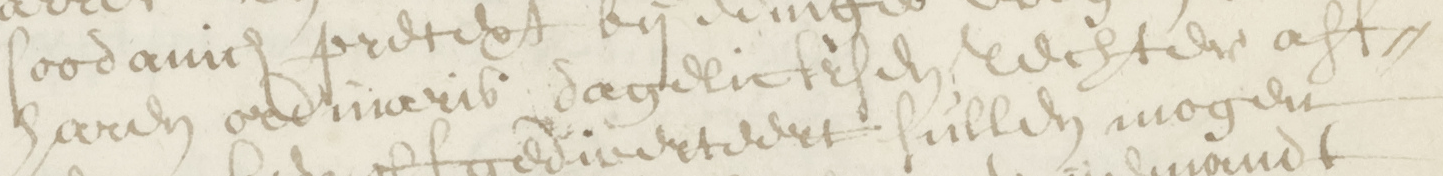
haren ordinaris dagelicksen rechter aff„
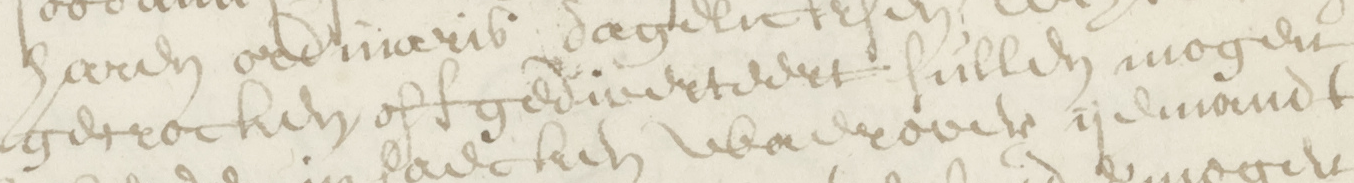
getrocken off gediverteert sullen mogen
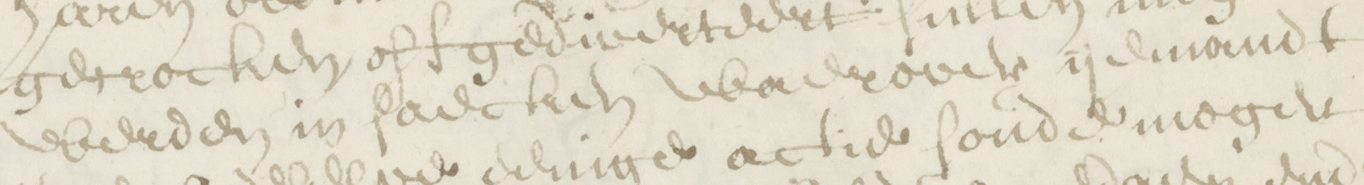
werden in saecken waerover ijemandt
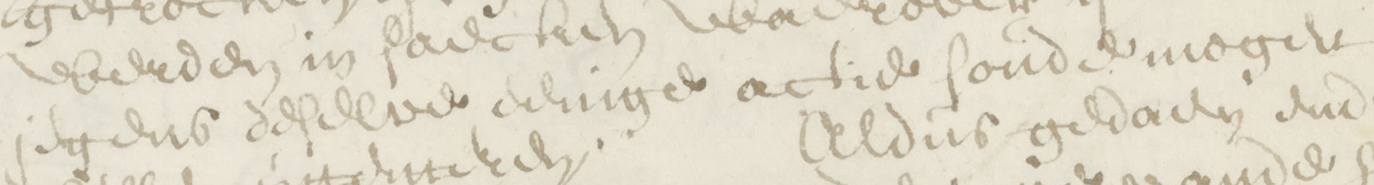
jegens deselve eenige actie soude mogen
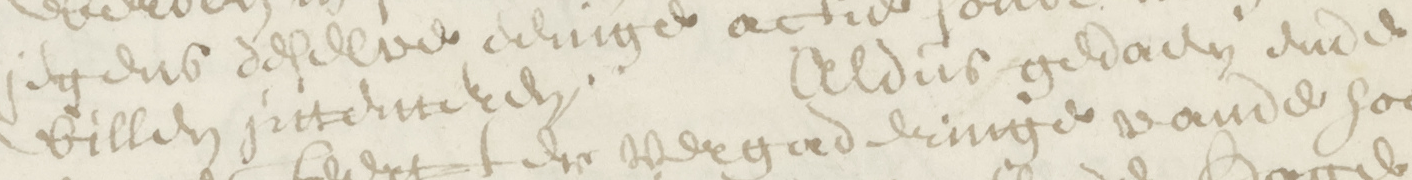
willen intenteren. Aldus gedaen ende
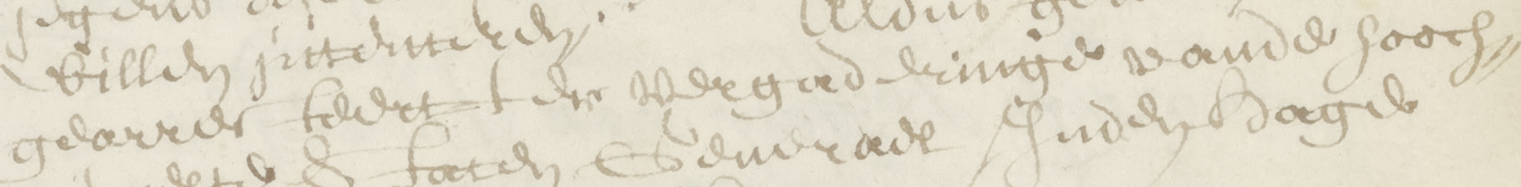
gearresteert ter Vergaderinge vande hooch„
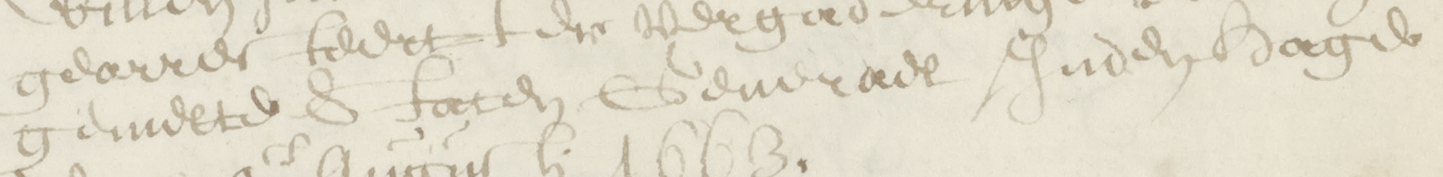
gemelte Staten Generael Inden Hage
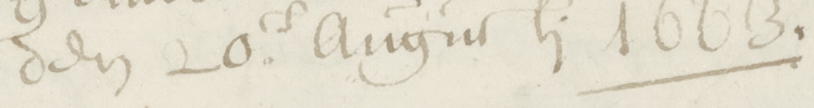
den 20te. Augusti 1663.
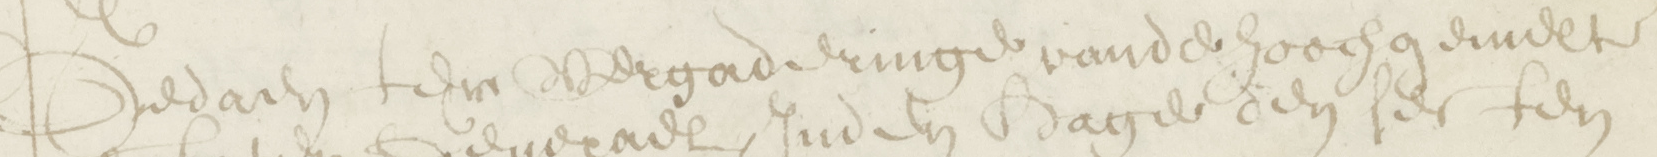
Gedaen ter Vergaderinge vande hooch gemelte
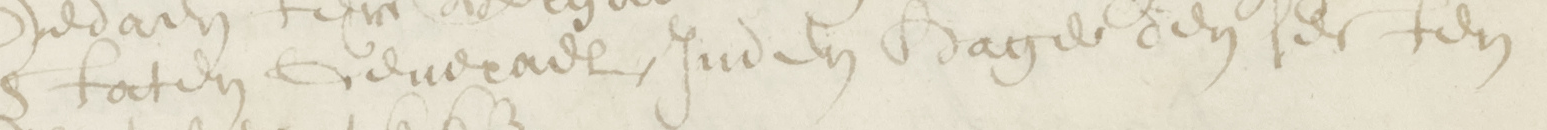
Staten Generael, Inden Hage den sesten
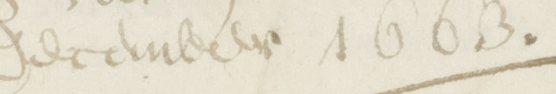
December 1663.
